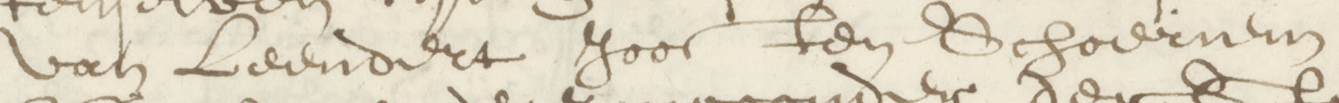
van Leendert Joosten Schoeriem,
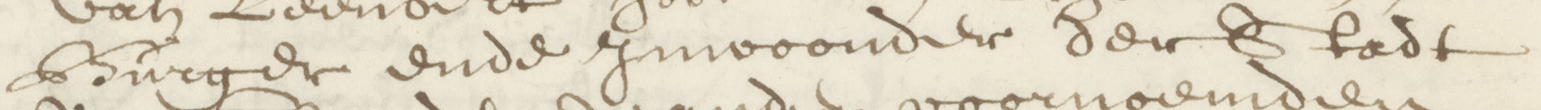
Burger ende Inwoonder der Stadt
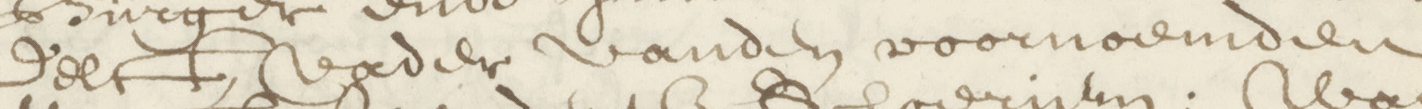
Delft, vader vanden voornoemden
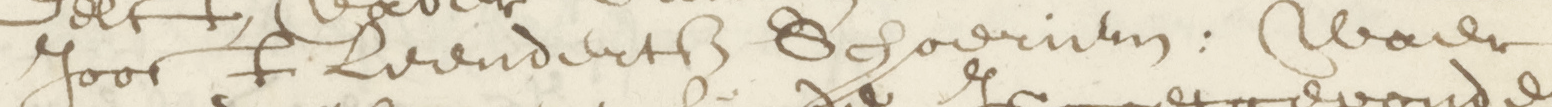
Joost Leendertsz Schoeriem: Waer
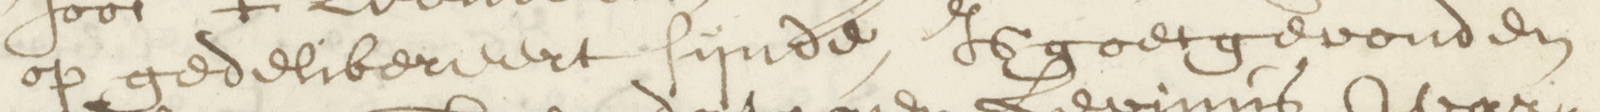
op gedelibereert sijnde, Is goetgevonden
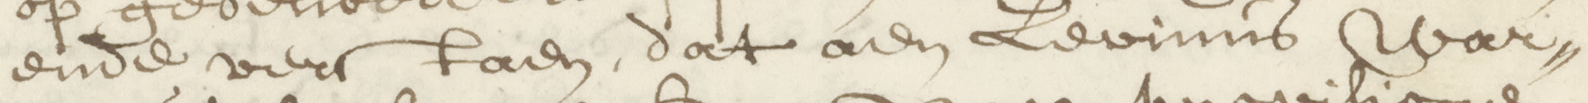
ende verstaen, dat aen Levinus War„
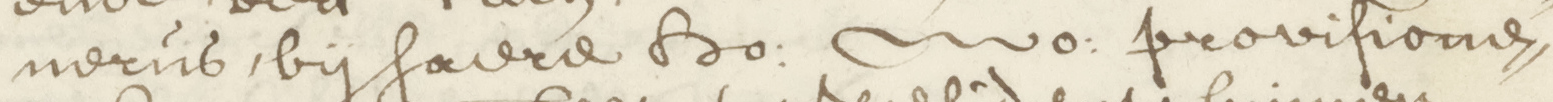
nerus, bij haere Ho:Mo: provisione„
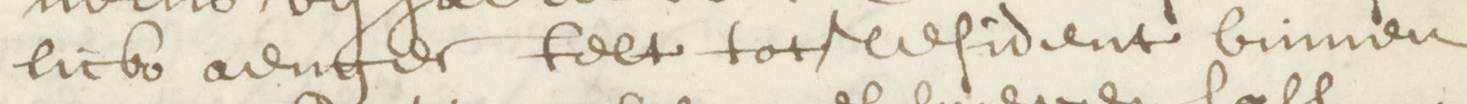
lick aengestelt tot Resident binnen
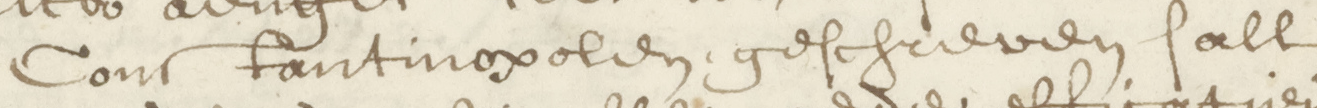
Constantinopolen, geschreven sall
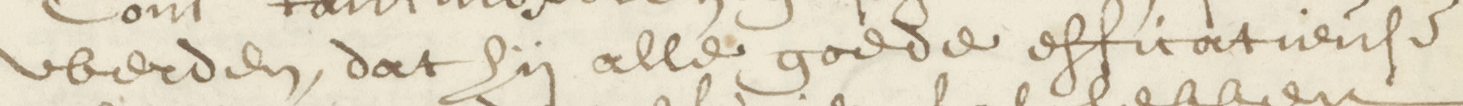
werden, dat hij alle goede efficatieuse
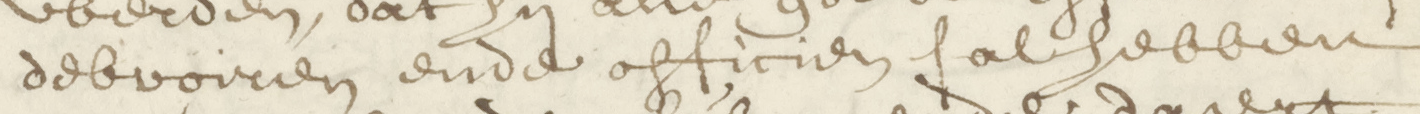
debvoiren ende officien sal hebben
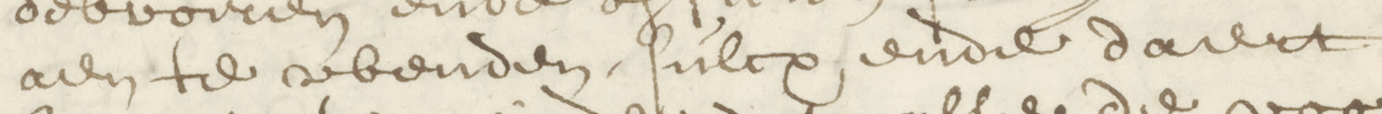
aen te wenden, sulcx ende daert
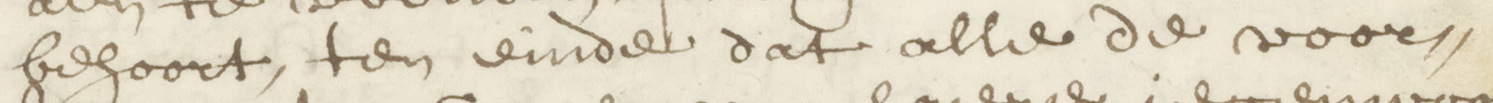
behoort, ten einde dat alle de voor„
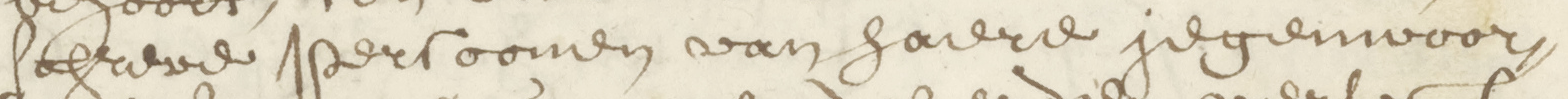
schreve Persoonen van haere jegenwoor„
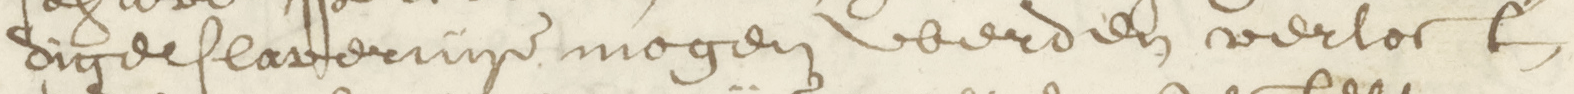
digde slavernije mogen werden verlost,
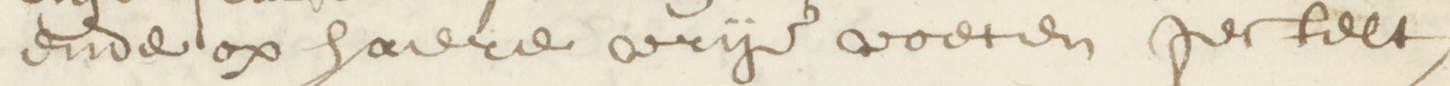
ende op haere vrije voeten gestelt.
